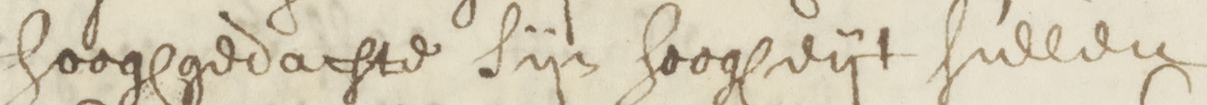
hooghgedachte Sijn hoogheijt sullen
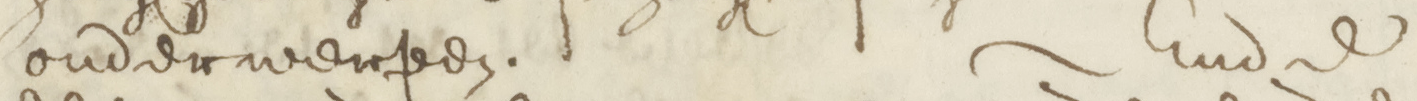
onderwerpen. Ende
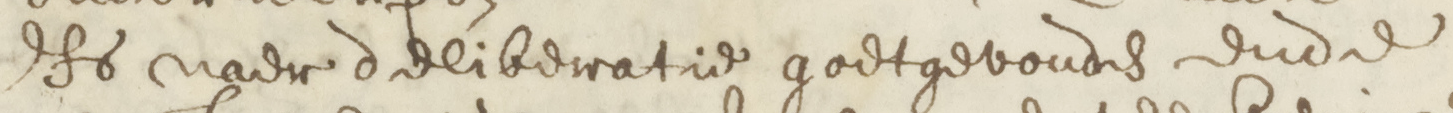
Is naer deliberatie goetgevonden ende
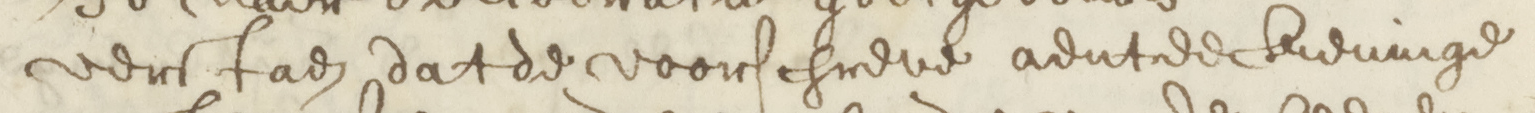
verstaen dat de voorschreve aenteeckeninge
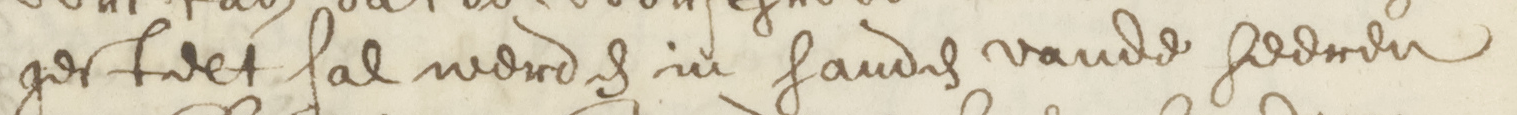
gestelt sal werden in handen vande heeren
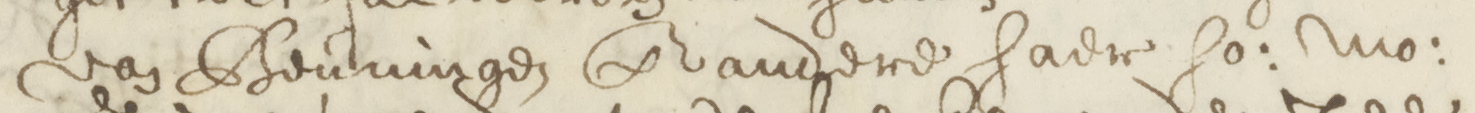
van Beuningen & andere haer Ho:Mo:
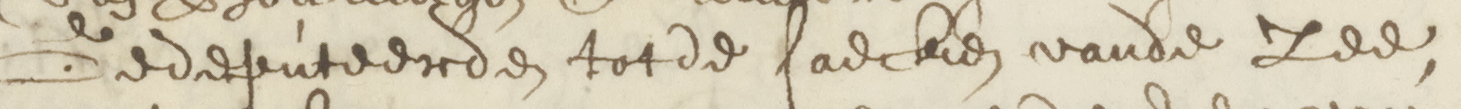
Gedeputeerden tot de saecken vande Zee,
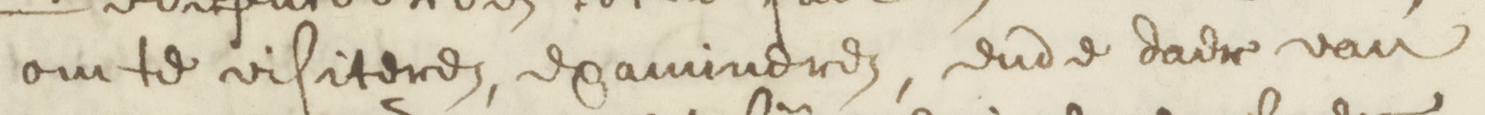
om te visiteren, examineren, ende daer van
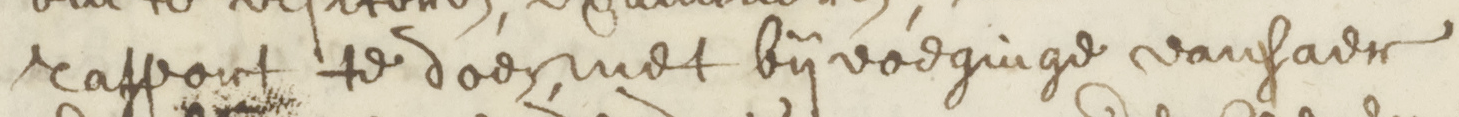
rapport te doen, met bijvoeginge van haer
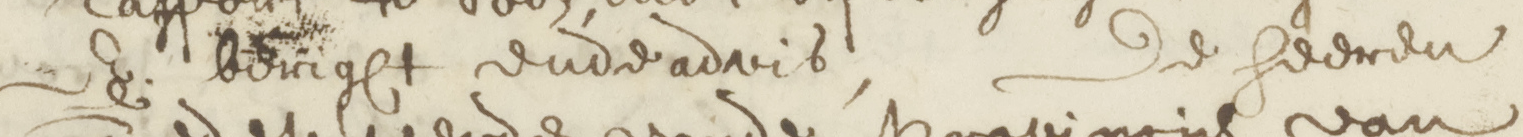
E. beright ende advis. De heeren
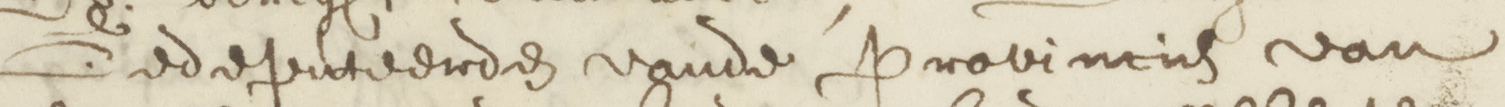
Gedeputeerden vande Provincien van
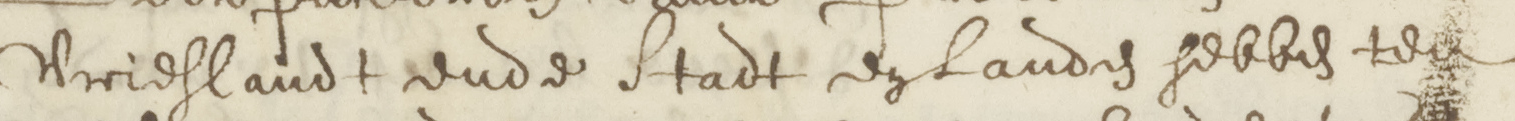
Vrieslandt ende Stadt en Landen hebben ten
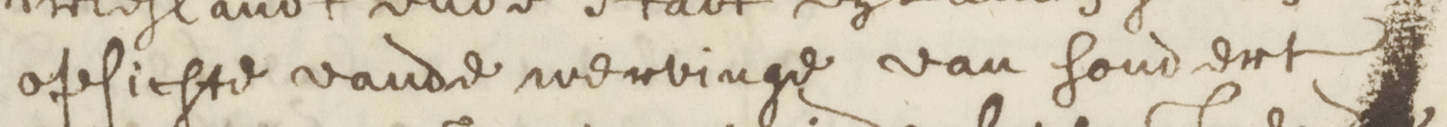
opsichte vande wervinge van hondert
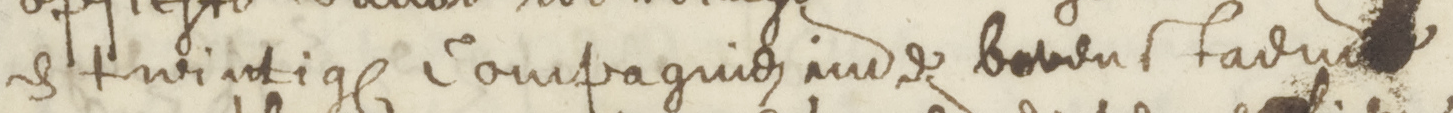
&twintigh Compagnien inde bovenstaende
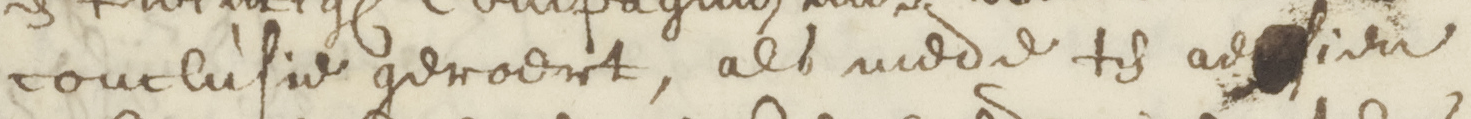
conclusie geroert, als mede ten aensien
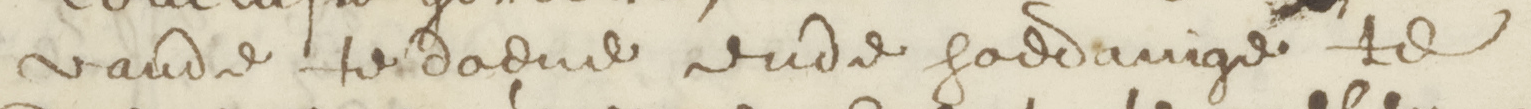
vande te doene ende hoedanige te
